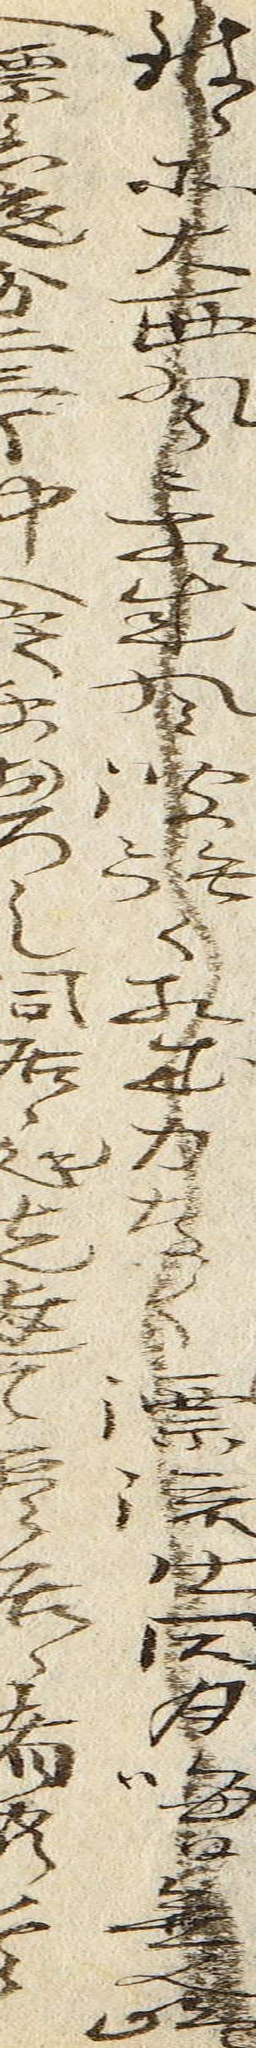へ漂着夜分二三丁沖へ碇をおろし伺居候処先達て参居候者共其
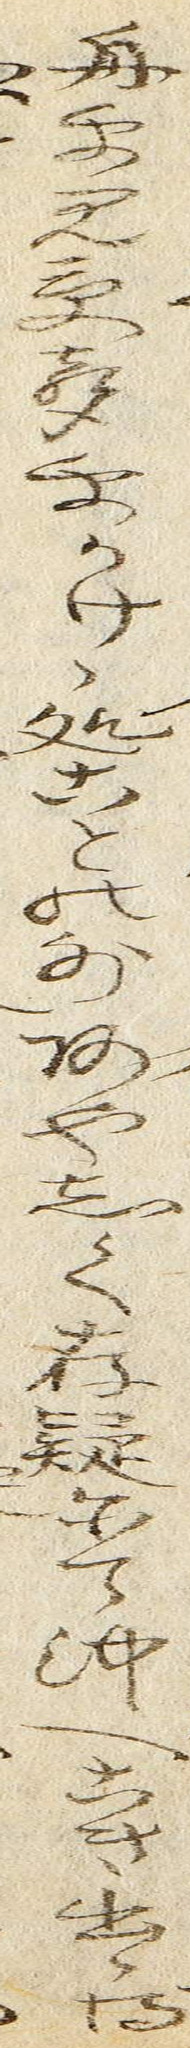舟を見受声をかけ候処ことの外あやしく存疑にて沖へこき出候得
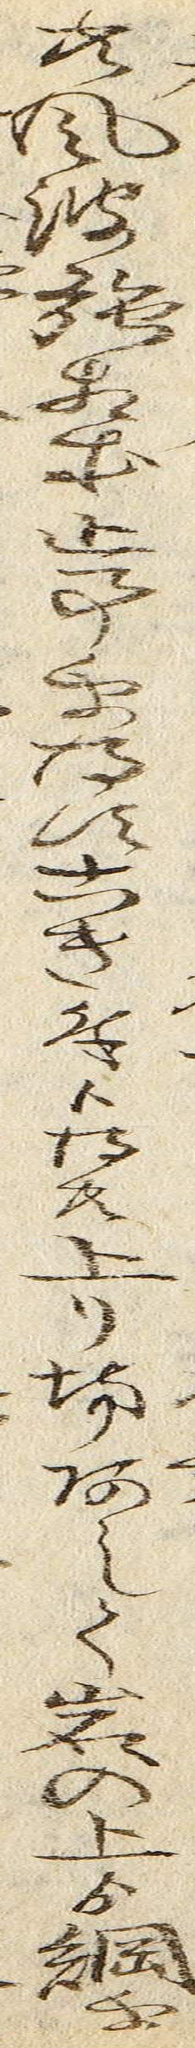共風波強相成止事を得すこき付候得共上り場あしく岩の上ゟ綱を
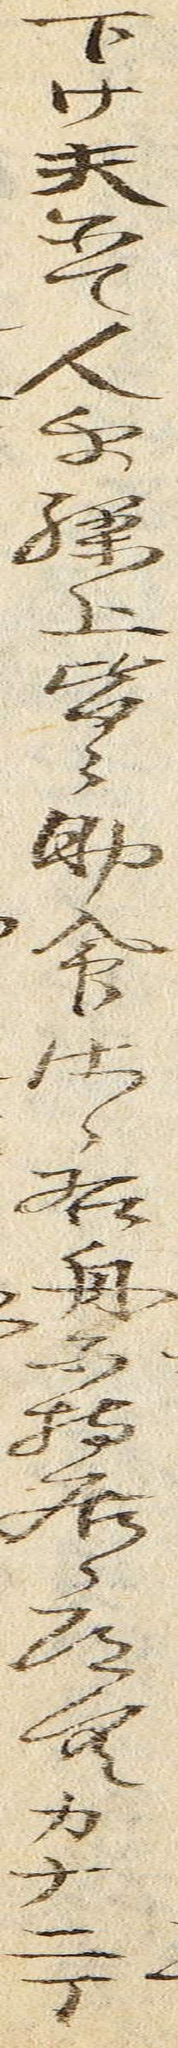下け夫にて人を繰上皆々助命仕候右舟に持居候道具カナ二丁
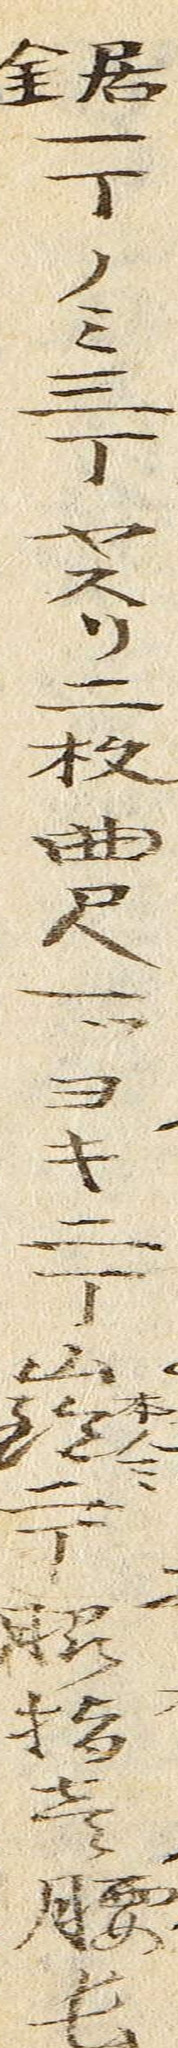鋸一丁ノミ三丁ヤスリ二枚曲尺一ツヨキ二丁山鉋二丁脇指壱腰長
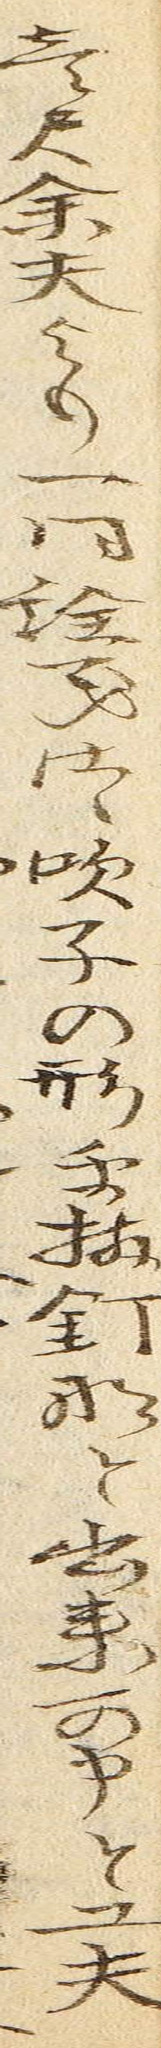壱尺余夫より一同詮義仕候吹子の形を拵釘なと出来可申と工夫
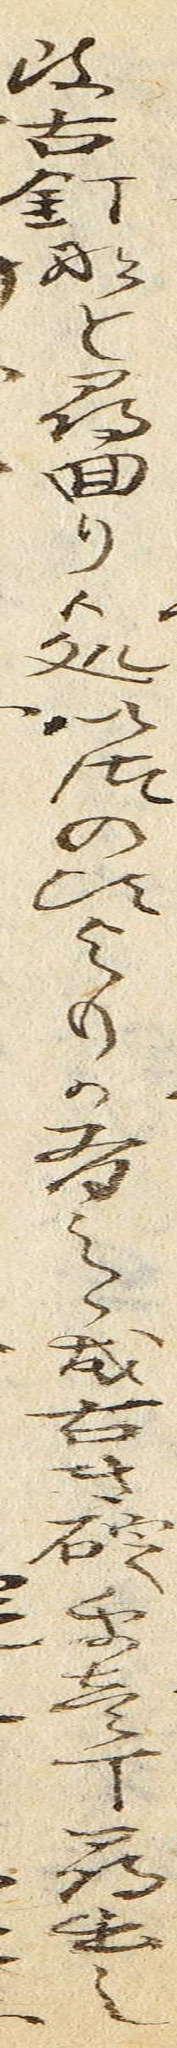致古釘なと尋回り候処いつの頃よりか有之候成古き碇を壱丁尋出し
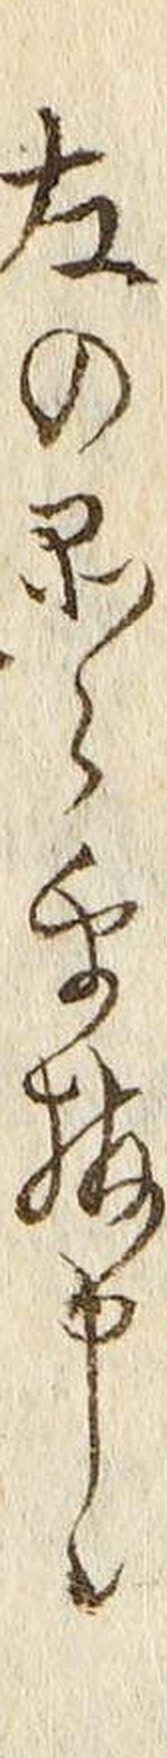左の品々を拵申候
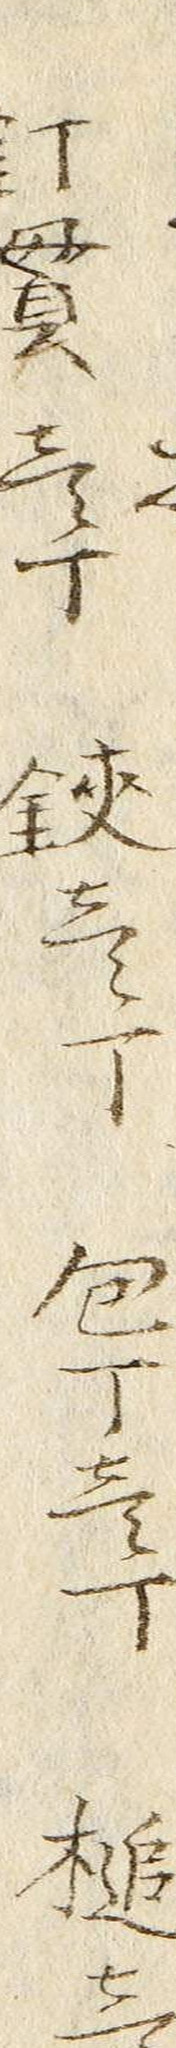釘貫壱丁鋏壱丁庖丁壱丁槌壱ツ
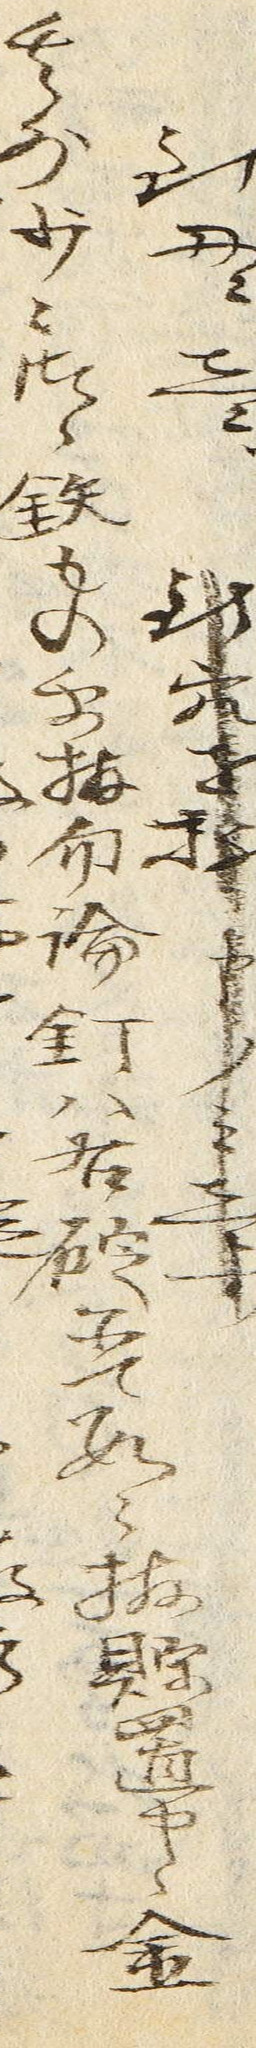其外少々つゝ鉄ものを拵勿論釘ハ右碇にて段々拵貯置申候金
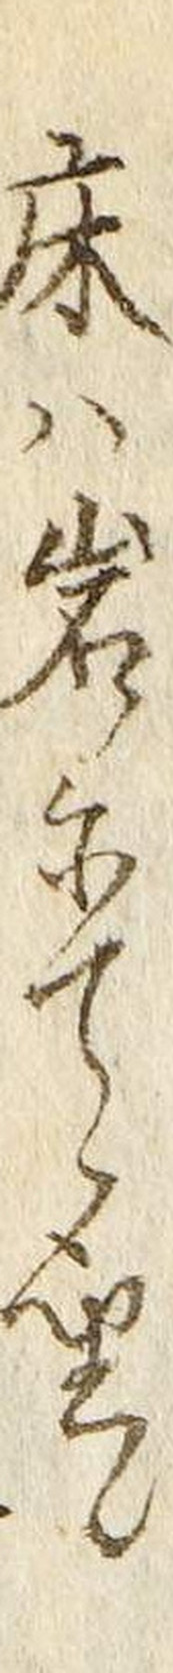床ハ岩にて御座候
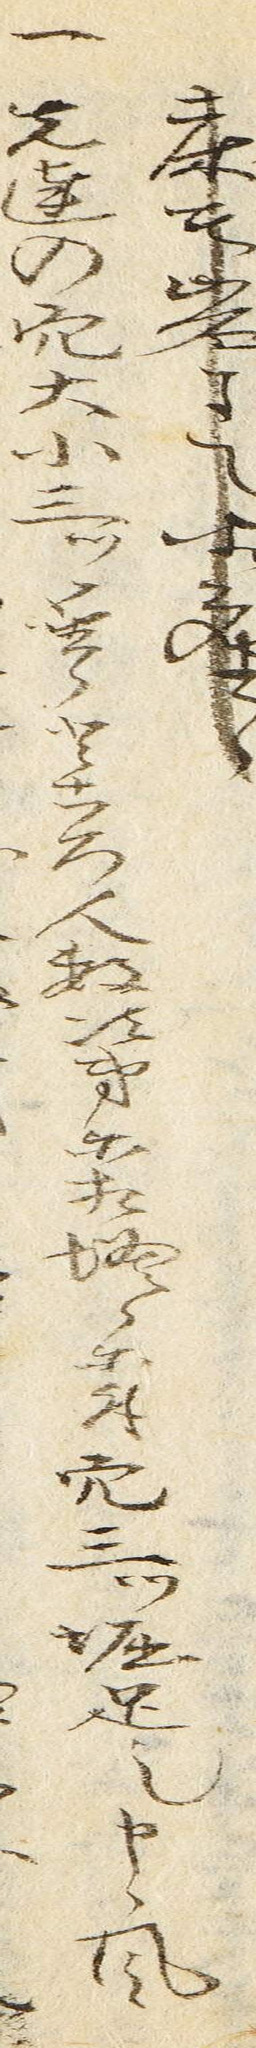一先達の穴大小三ツ御座候ところ人数次第に相増候に付穴三ツ堀足し申候風
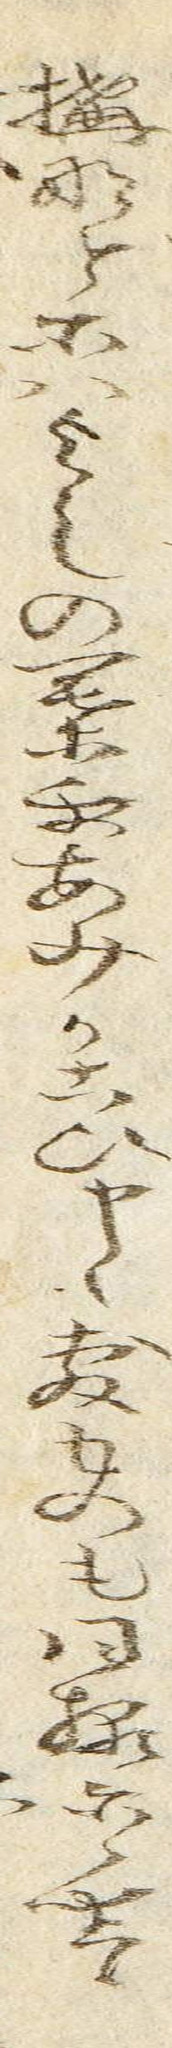構なとにハよしの葉をあみかこひ申候敷ものも同様に御座候
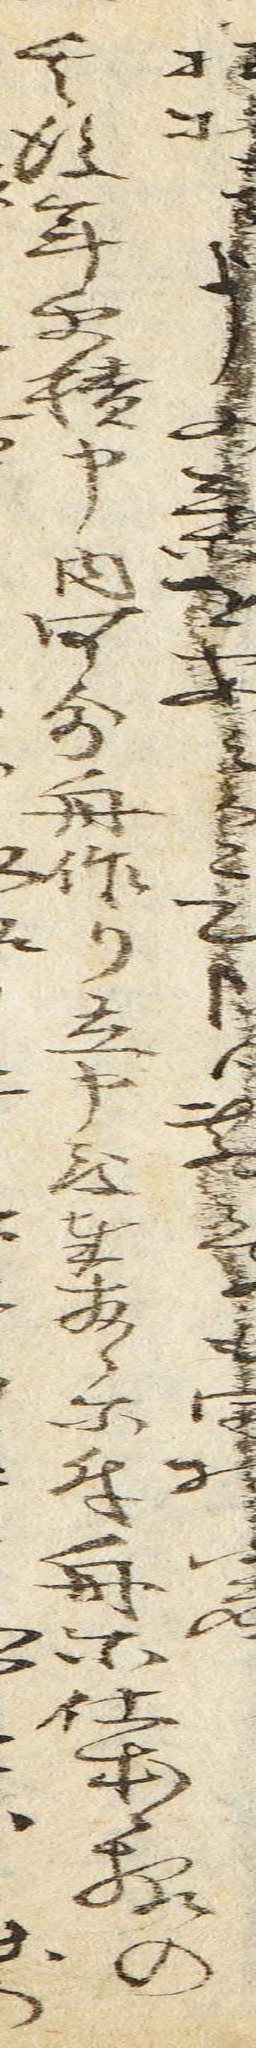一其後年を積申内何分舟作り立申度奉存候に付舟に仕成候様の
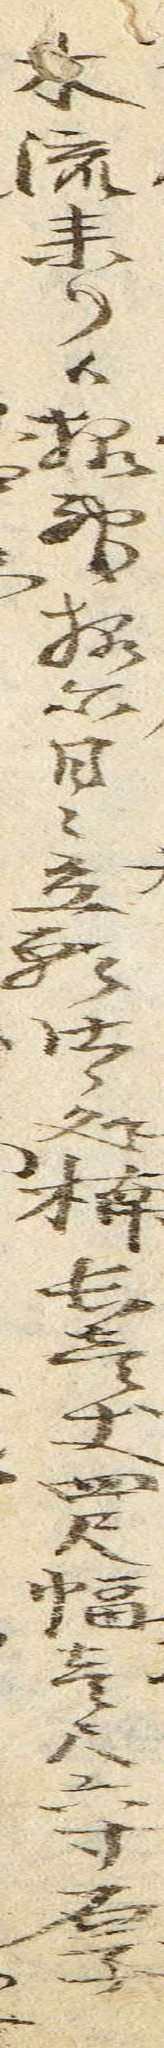木流来り候様神様に日々立願仕候処楠長壱丈四尺幅壱尺六寸厚
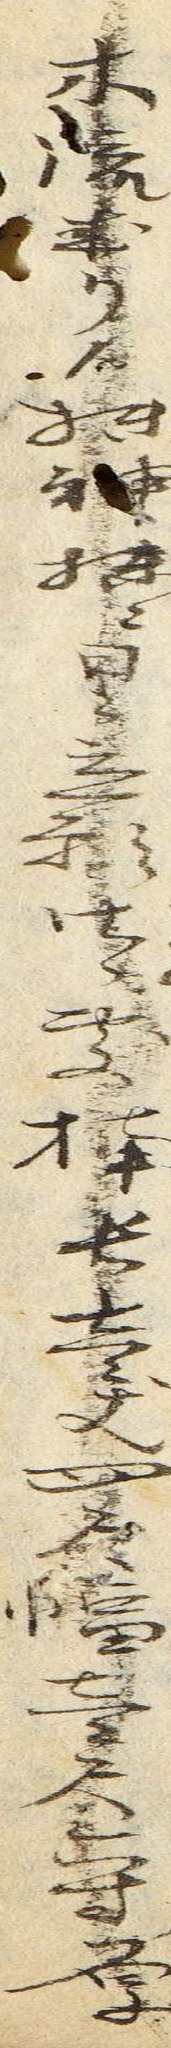木流来り候様神様に日々立願仕候処楠長壱丈四尺幅壱尺六寸厚
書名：無人島漂流書付
